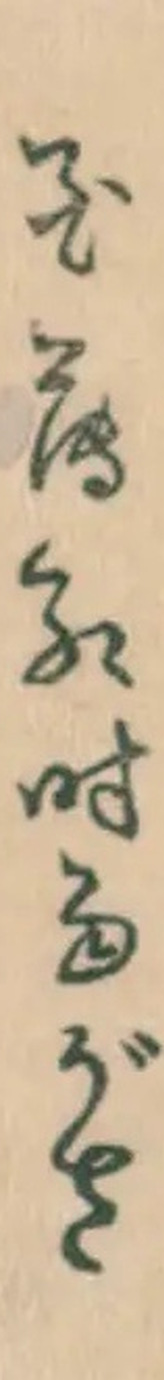花薄紅時雨がさ
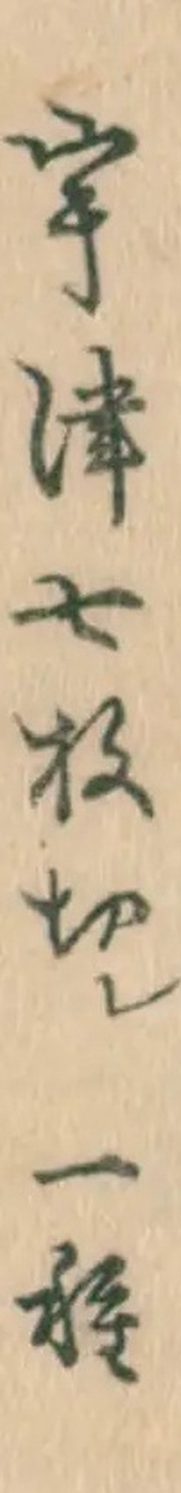宇津七枚切レ一種
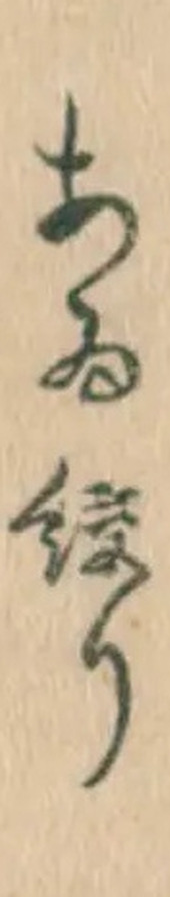あゐ絞り

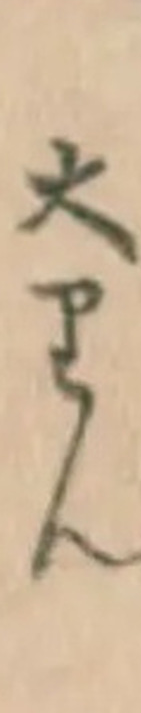大りん
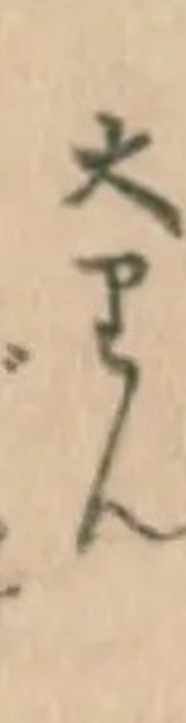大りん
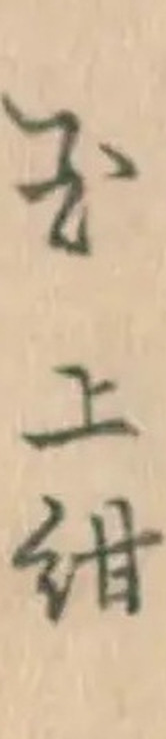花上紺
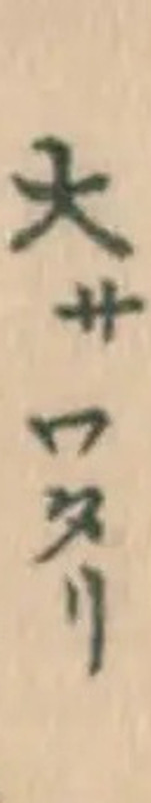大サワタリ
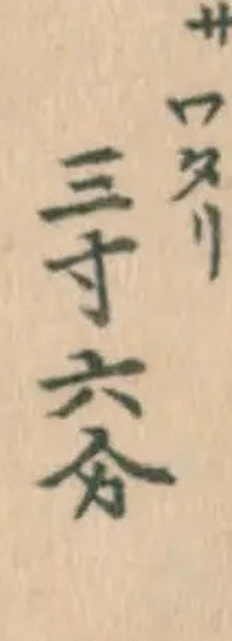三寸六分
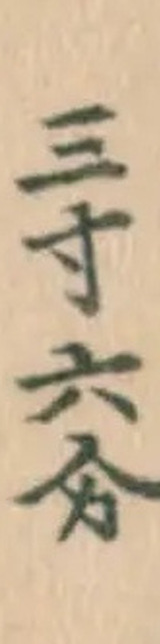三寸六分
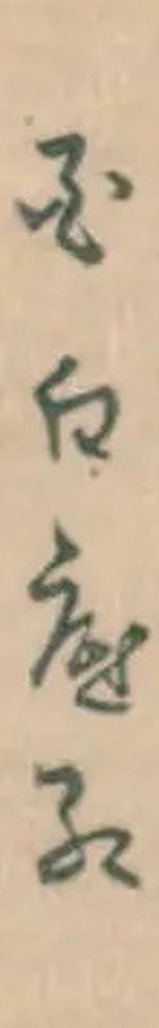花白底紅

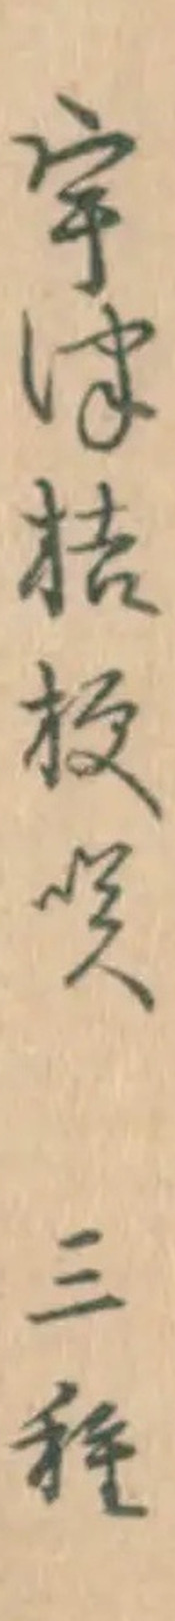宇津桔梗咲三種
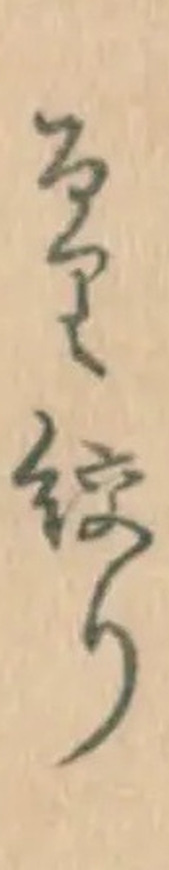るり絞り
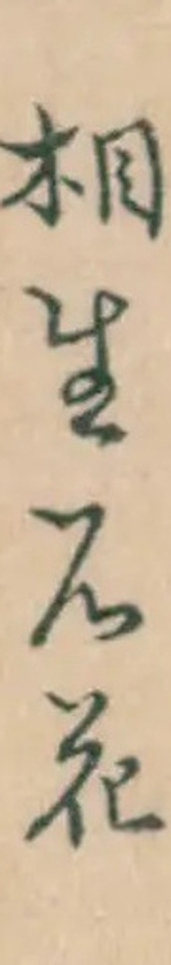相生石花

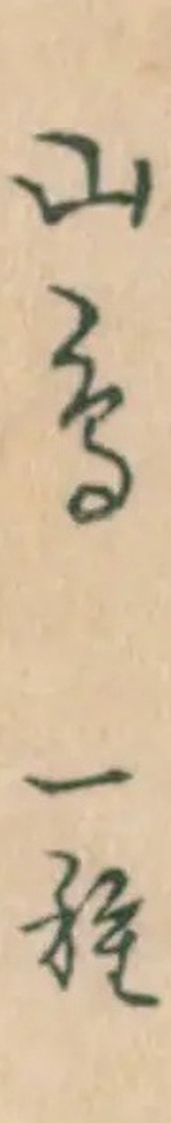山鳥一種
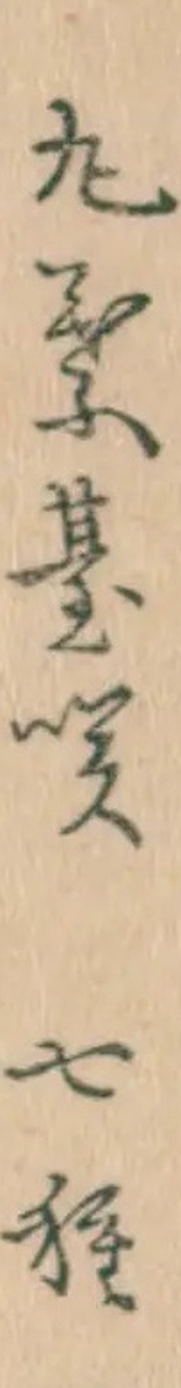丸葉台咲七種
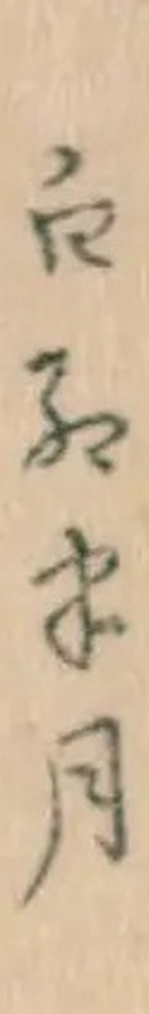白紅半月
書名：朝顔叢. 上巻
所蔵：国立国会図書館 National Diet Library, JAPAN
